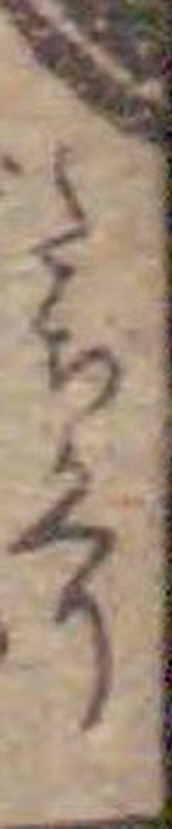たちかへり
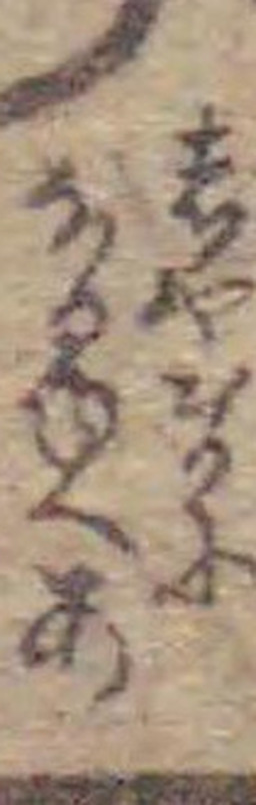なるゆへあ
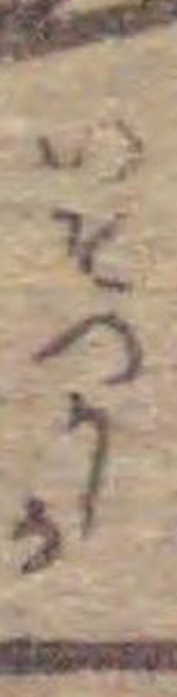いそつかしか
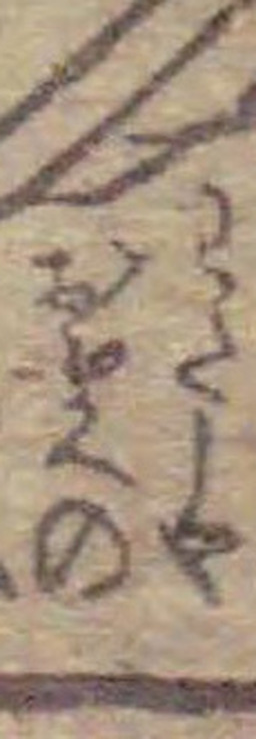おまへの
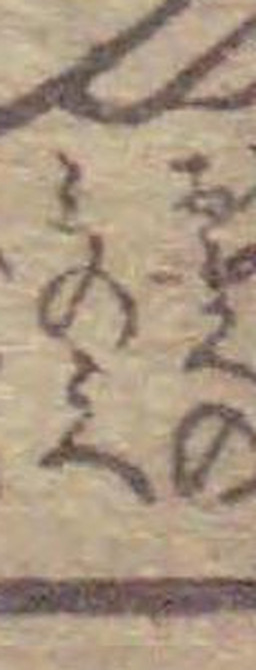みのうへ
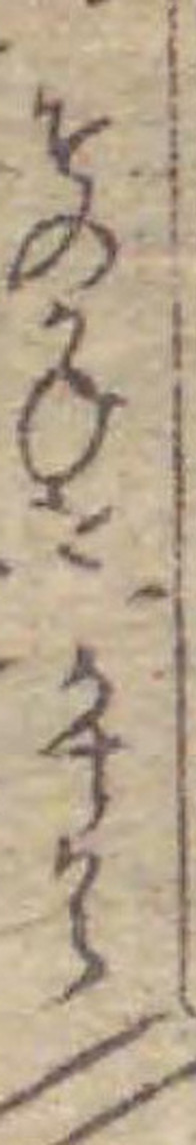そのかねをかすから
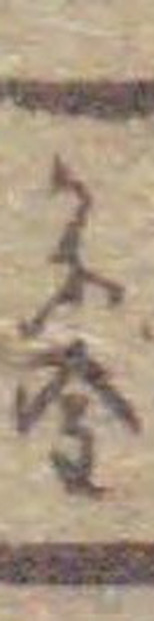かに金
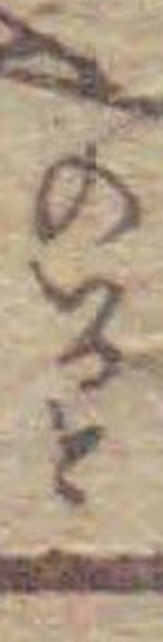のいると
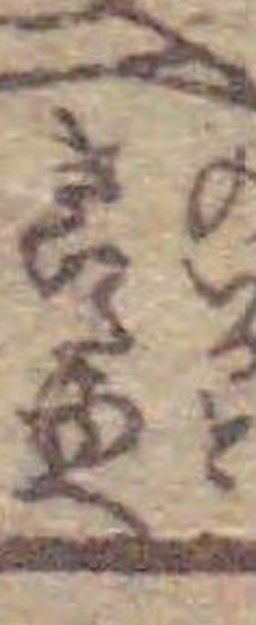きいたゆへ
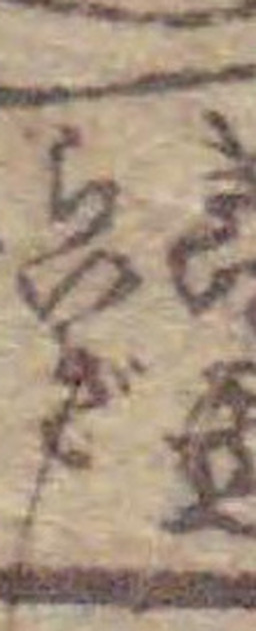らいぎ
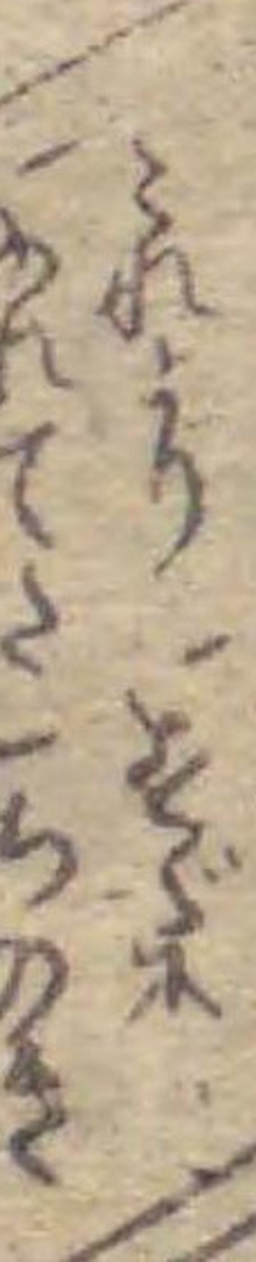つれてたちのき
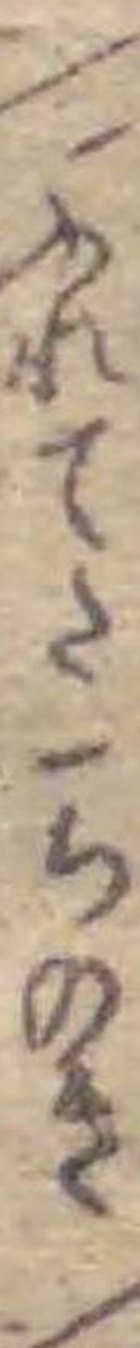つれてたちのき
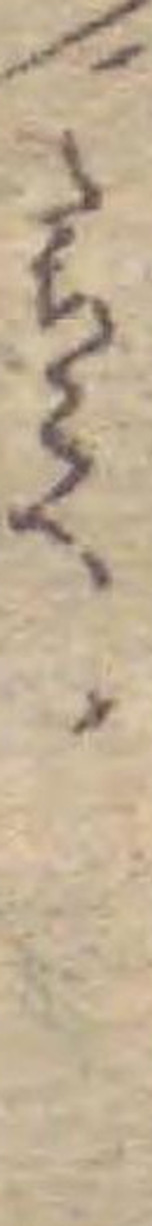たちこへ
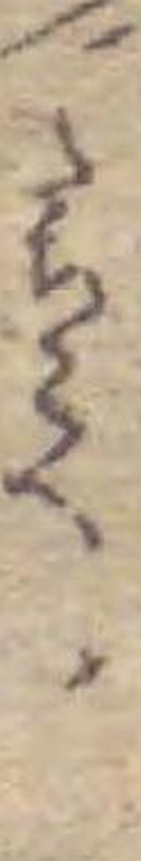たちこへ
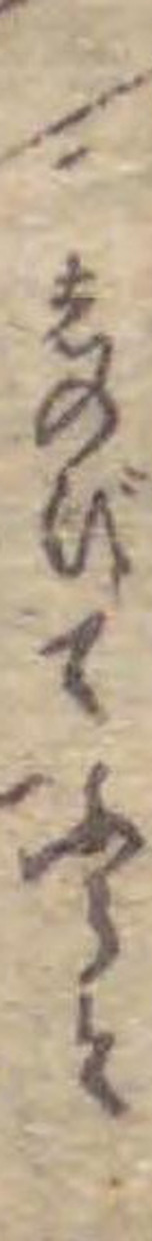しのびてふうと
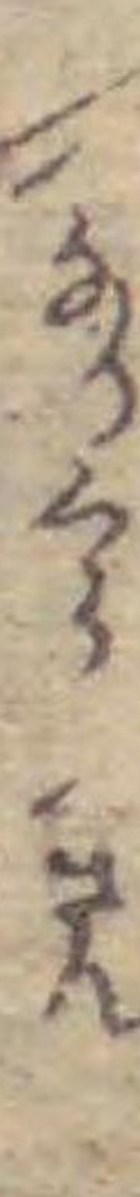なりくらさん
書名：芸者呼子鳥 : 2巻（松泉堂）
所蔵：国立国会図書館 National Diet Library, JAPAN
